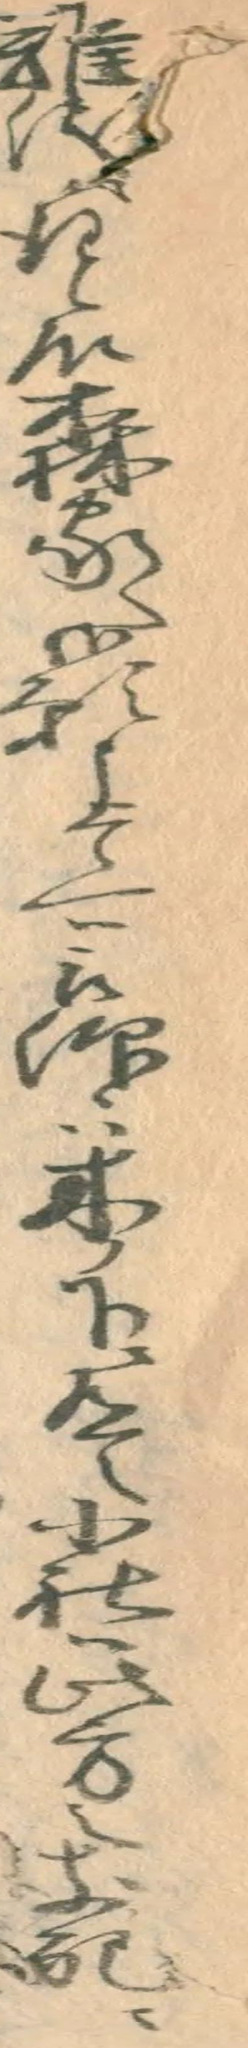難儀ニ存候故森家へ御願申上候へハ被仰候ハ木ノ下ニ有之小社ハ此方之支配ニ
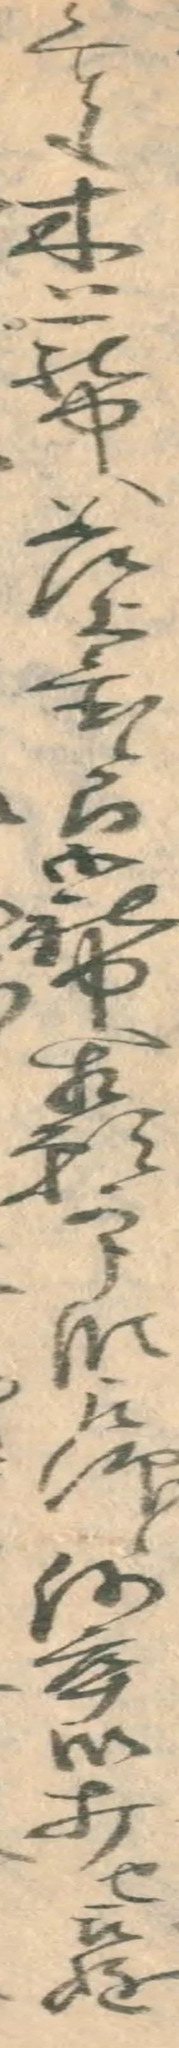候へとも木ハ一社中へ差上置候間御社中へ相願可申段被仰候何卒御打せ被遊
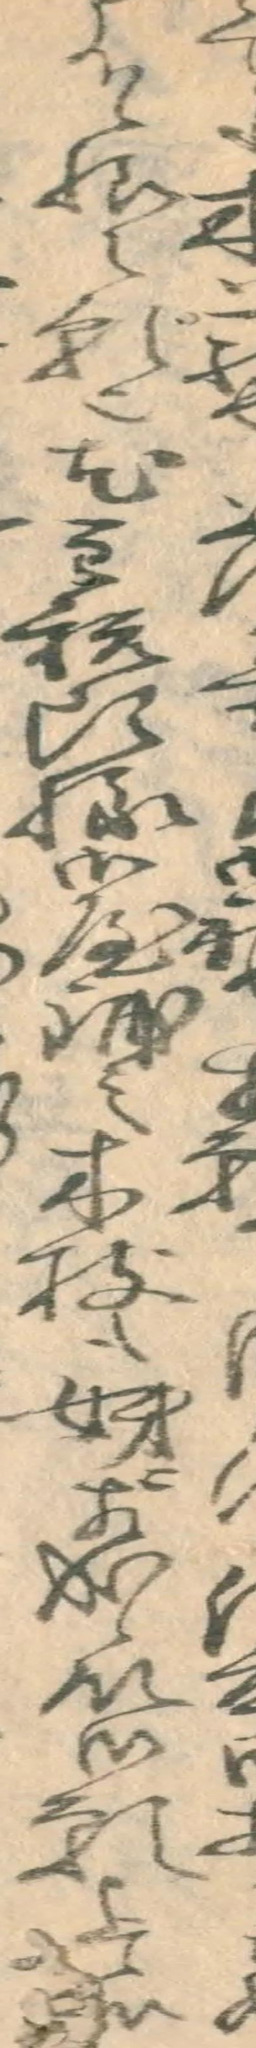申下候様之願也尤主税頭様御屋鋪之木枝も姉ニ相成候故御願申上候処
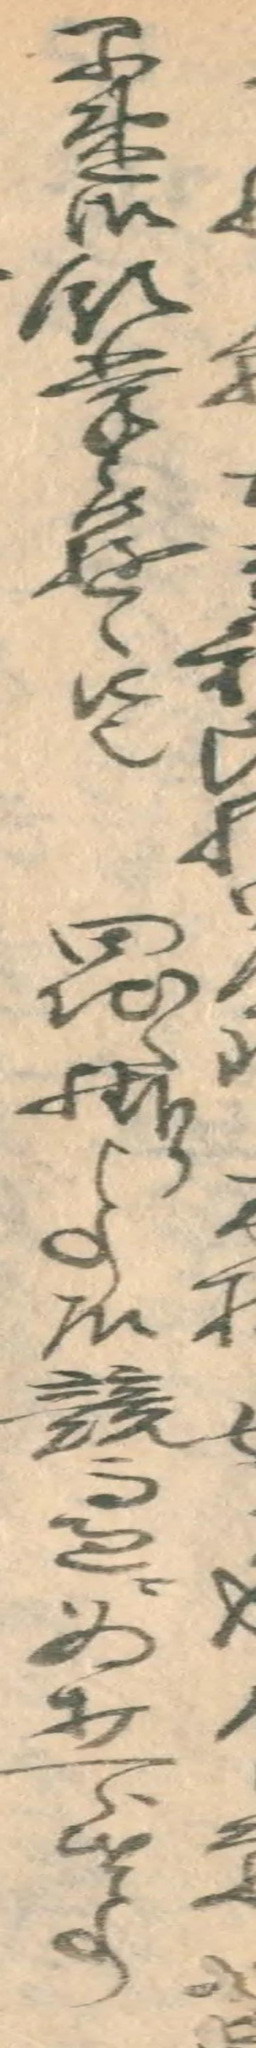早速御領掌被遊候由也田地へ掛り申事故競馬過ニ為打可被遣候事
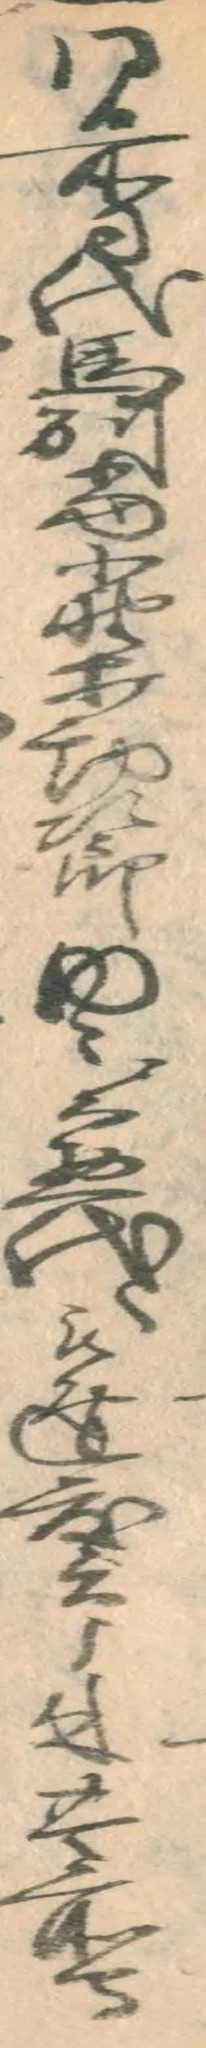一同日所司代馬別当小野打勘次郎内々ニ而惣代へ被逢度旨申来豊前守
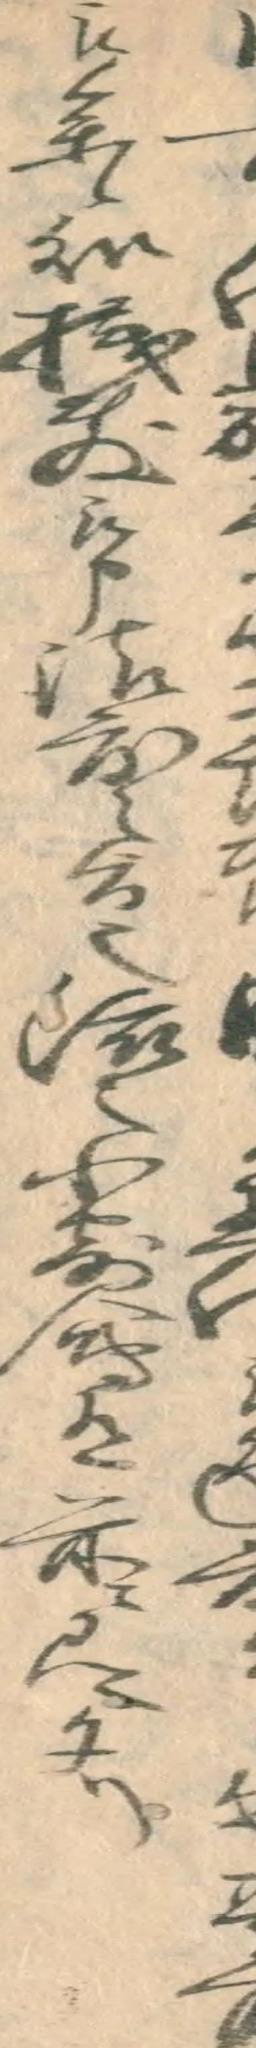被参候処桟敷被申請度之旨也依之小寄会有前ニ見へタリ
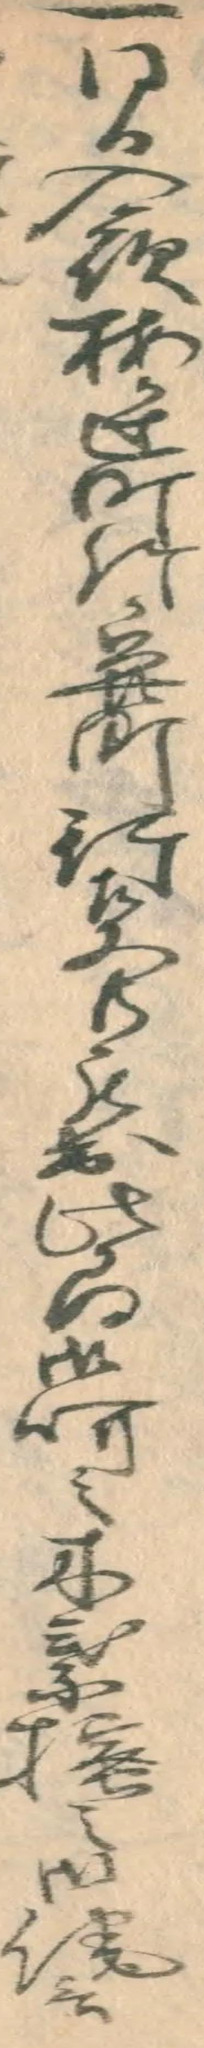一同日入夜梅か辻町竹鼻町行事共罷出此間御呵之木葉掻之御詫言
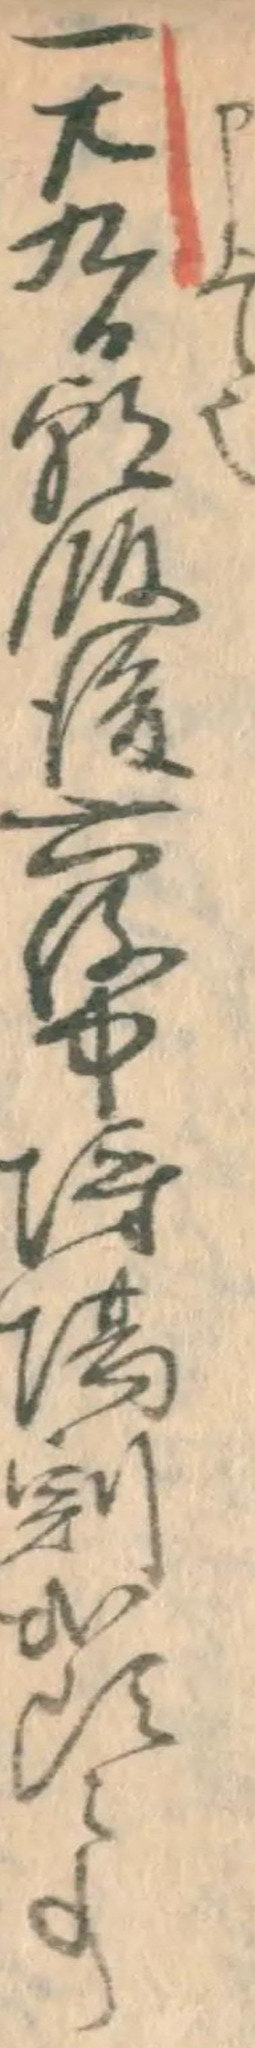一廿九日朝飯後六役中埒場割出頭之事
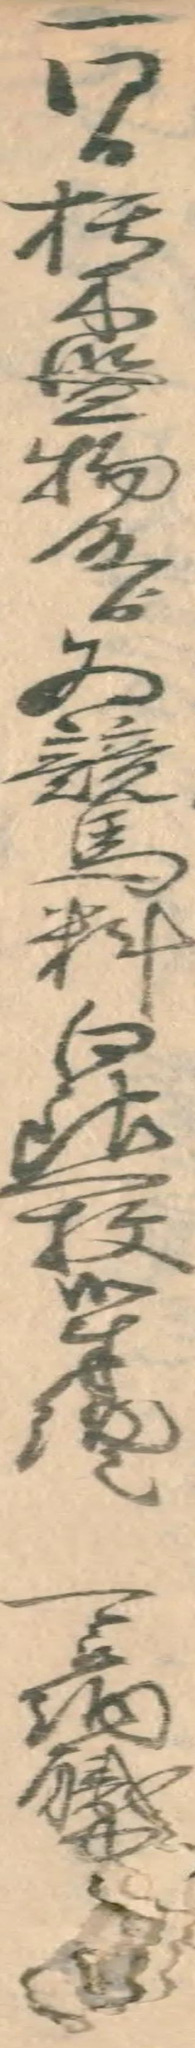一同日朽木監物殿ゟ為競馬料白銀一枚御奉納也可被納職中
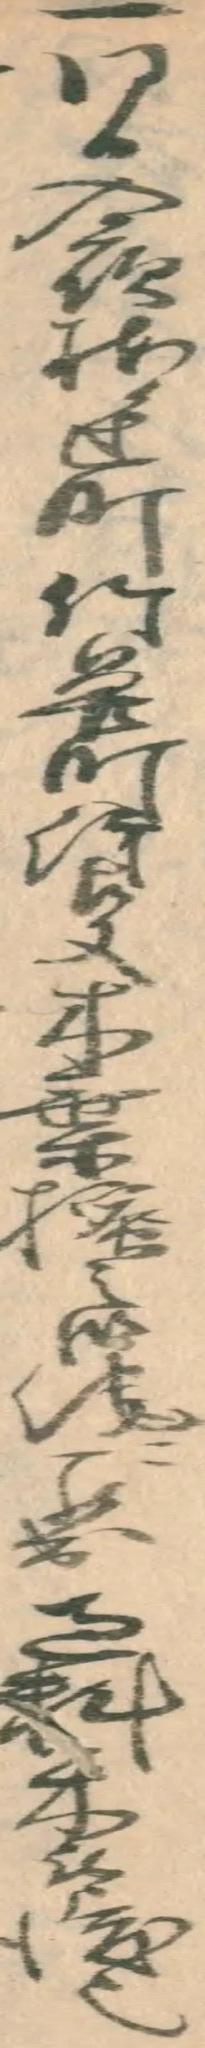一同日入夜梅か辻町竹鼻町行事木葉掻之御詫ニ罷出過料米被渡也
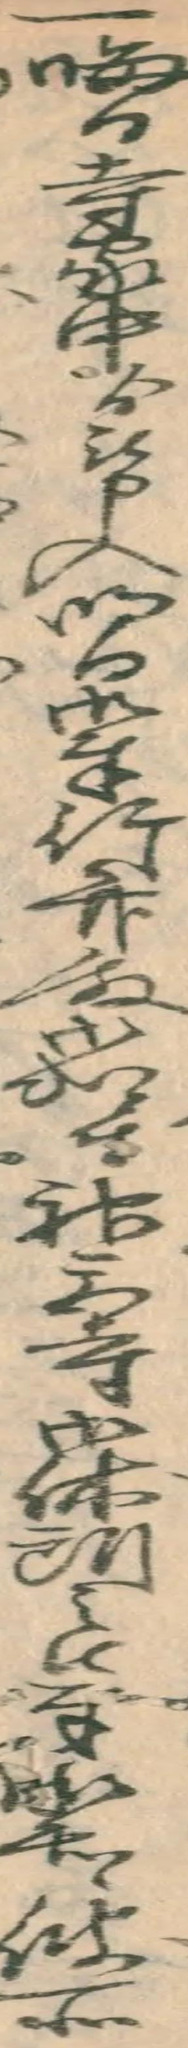一晦日寺家中ゟ被申入明日御奉行弁殿御出ニ付神宮寺御休所之由奉承知候彼所
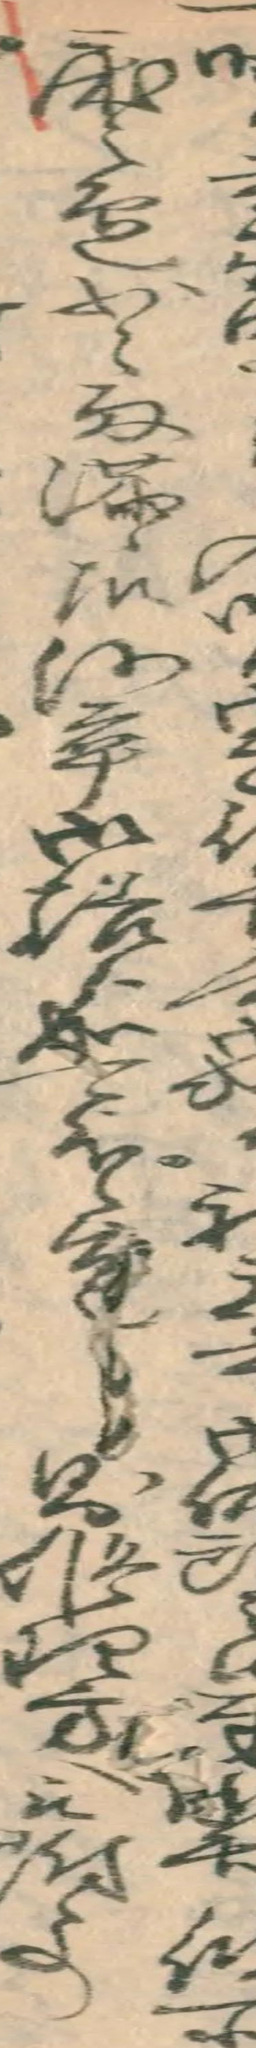床之辺少々雨漏候故何卒御繕被成可被下候旨也則修理方へ被付候事
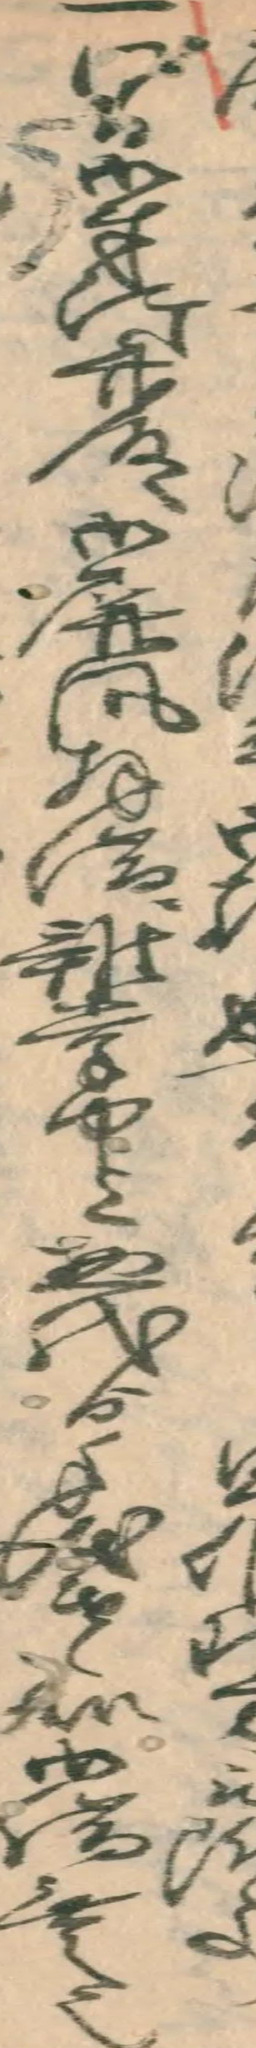一同日御奉行弁殿へ御屏風拝借ニ雑掌中迄惣代ゟ手紙遣候処御借無之也
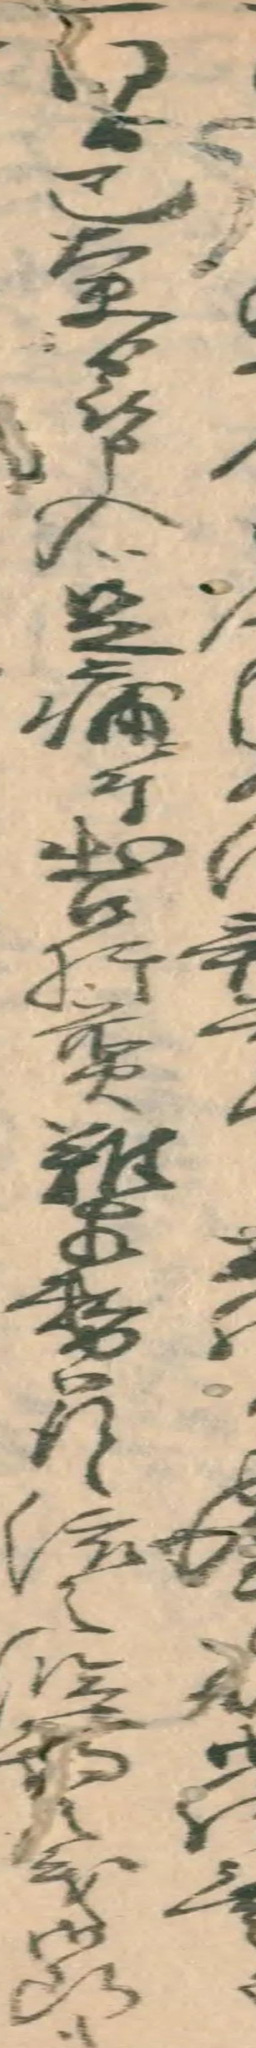一同日巳大夫ゟ被申入ハ足痛ニ付出口肝煎難相務御座候依之臨之義御断も
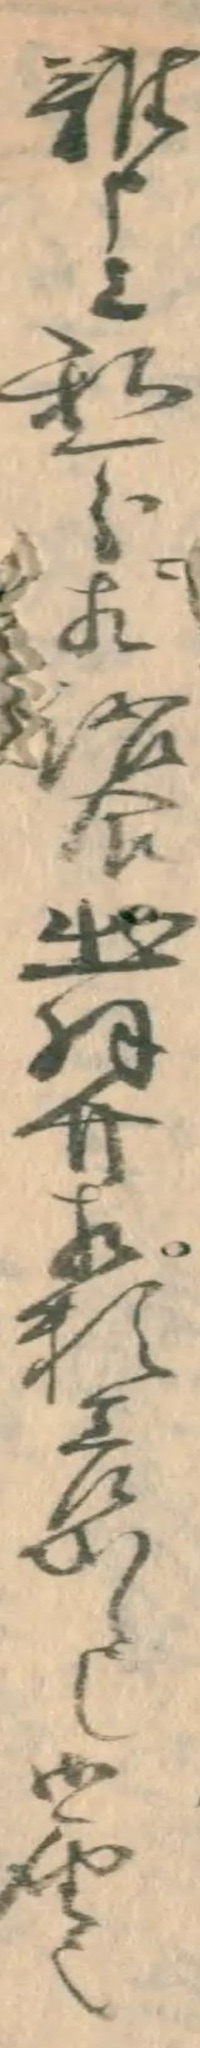難申上私一分ニ相語合出羽介相頼差出し申候御届也
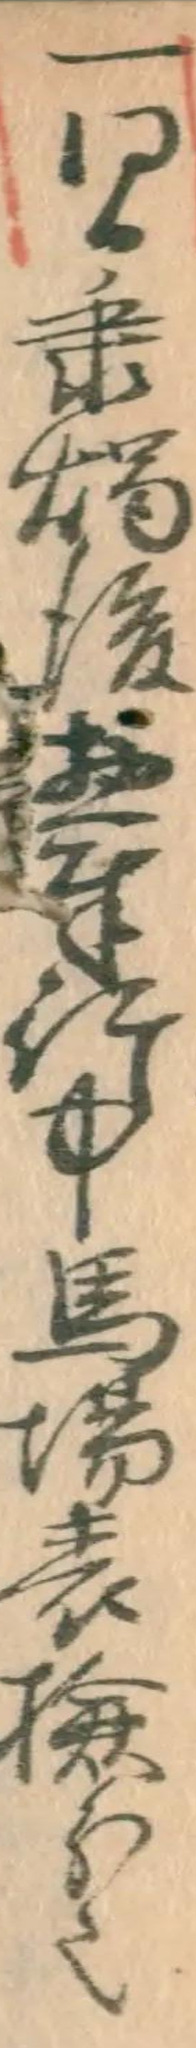一同日秉燭後惣奉行中馬場表検分也
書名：賀茂社記録. 第58冊
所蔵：国立国会図書館 National Diet Library, JAPAN
